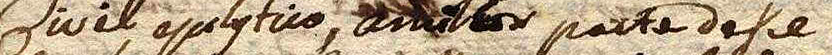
Civil, e polytico, a melhor parte desse
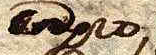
copro,
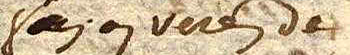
foj as vezes de
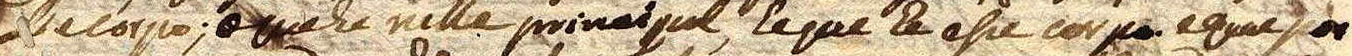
_e corpo; o que he nelle principal, he que he esse corpo. e que por
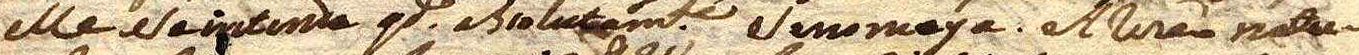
elle se intenda qd.o absolutam.te se nomeya. A Rezão natu
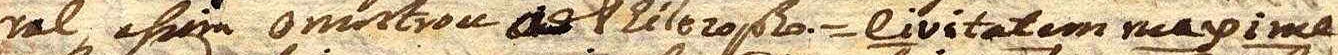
ral, assim o mostrou ao Philozopho.= civitatem maxime
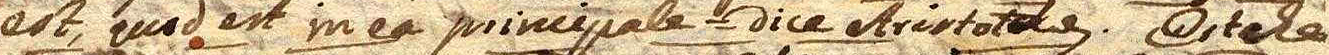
est, quid est mea principale= dice Aristoteles. Este he
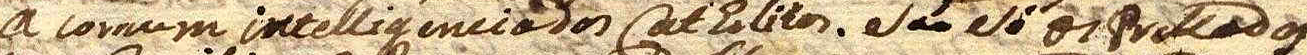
a comum intelligencia dos Catholicos. São só os Prellados
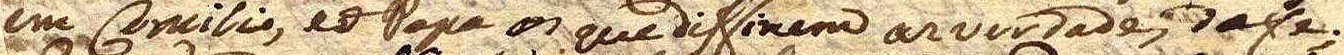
em Concilio, e o Papa os que diffinem az verdades da fe.
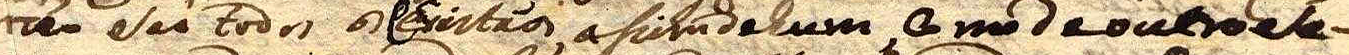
não são todos os Christãos, assim de hum como de outro se
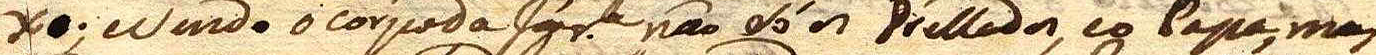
xo; e sendo o corpo da Jgr.a não só os Prellados, e o Papa, mas
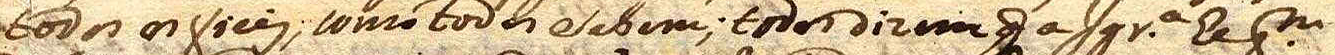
todos os fieis, como todos sabem; todos dizem q̄ a Jgr.a he q̄.m
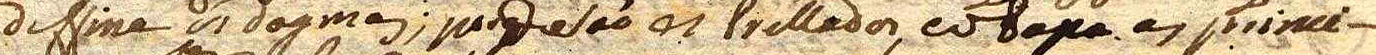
deffine os dogmas; porq̄ saõ os Prellados, e o Papa as princi
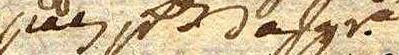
paes ptes da Jgr.a
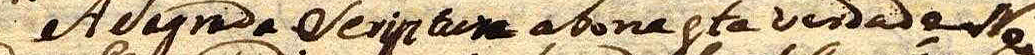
A sagrada scriptura abona esta verdade No
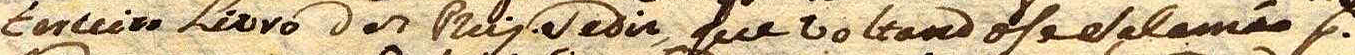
terceiro Livro dos Reis se diz, que voltando so salamão p.a
